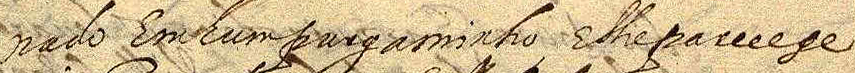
nado Em hum purgaminho, E lhe parece se
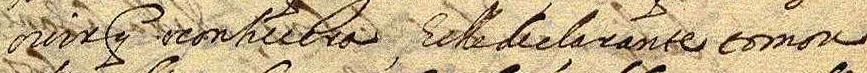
o uir q̄ o conhecera, E elle declarante tomou
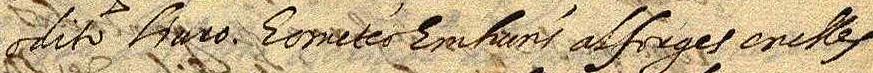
o dito liuro. E o meteo Em huns alforges e nelles
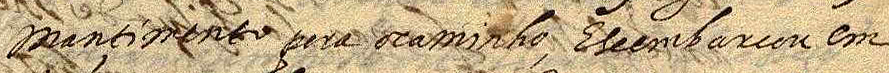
mantimento pera o caminho, E se embarcou em
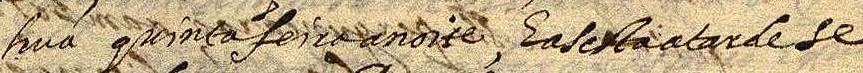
huā quinta feira a noite, E a sesta a tarde se
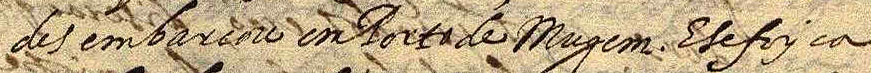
desembarcou em Porto de Mugem. E se foy ca
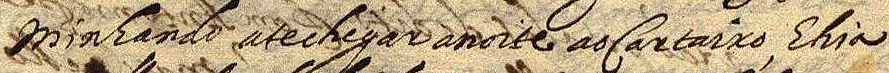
minhando ate chegar a noite ao Cartaixo, E hia
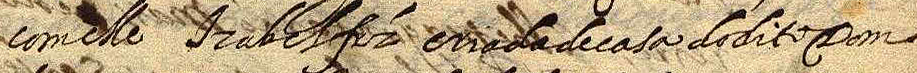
com elle Izabel frz̄ criada de casa do dito Dom
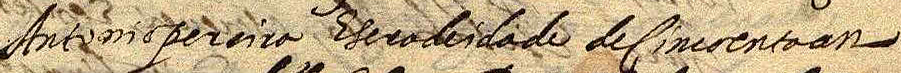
Antonio pereira E sera de idade de Cincoenta an
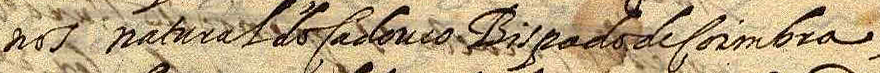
nos natural do Cadouco Bispado de Coimbra,
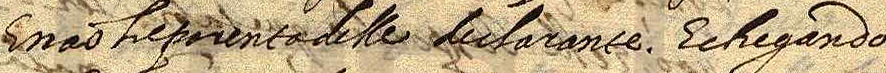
E naõ he parenta delle declarante. E chegando
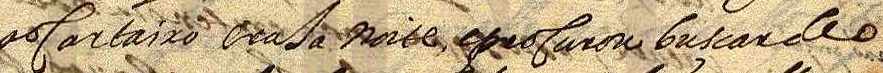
ao Cartaixo era Ia noite, e proCurou buscar de
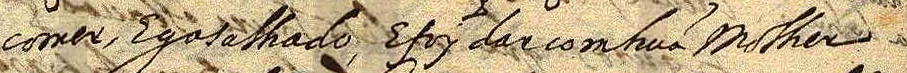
comer, E gasalhado, E foy dar com huā Molher
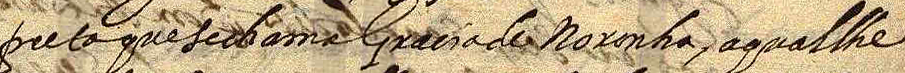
preta que se chama Gracia de Noronha, a qual lhe
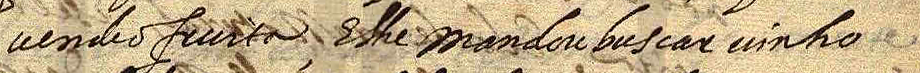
uendeo fruita, E lhe mandou buscar uinho
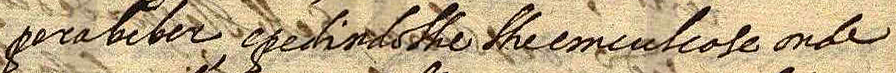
pera beber, e pedindolhe lhe emculcase onde
